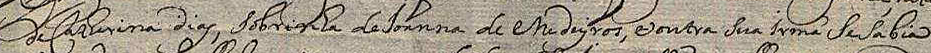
de Catherina dias, Sobrinha de Ioanna de Medeyros, e outra sua irmā Se Sabia
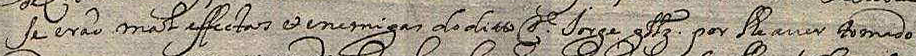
Se erão mal affectas e enemigas do ditto P.e Iorge gllz̄ por lhe auer tomado
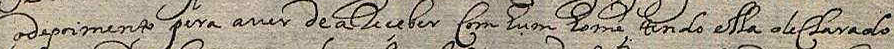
o depoimento pera auer de a Receber Com hum homē tendo ella deClarado
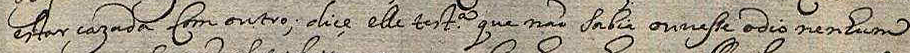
estar cazada Com outro; dice elle test.a que não sabia ouuesse odio nenhum
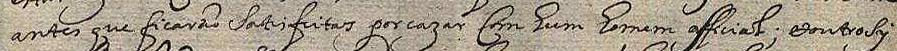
antes que ficaraõ satisfeitas por cazar Com hum homem official; e outrosy
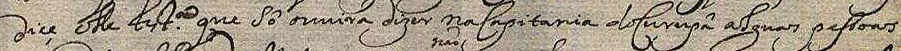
dice elle test.a que sô ouuira dizer na Capitania do Curupâ alguas pessoas
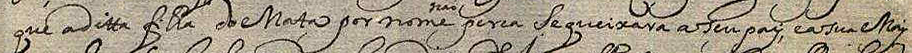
que a ditta filha do Mata por nome não perca, Se queixara a seu pay, e a sua May
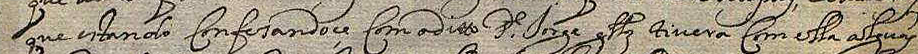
que estando Confesandoce Com o ditto P.e Iorge gllz̄ tiuera Com ella alguās
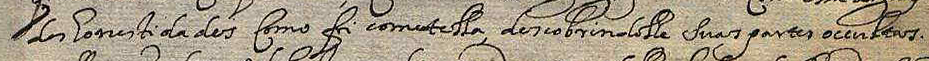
deshonestidades Como foi cometella, descobrindolhe Suas partes occultas.
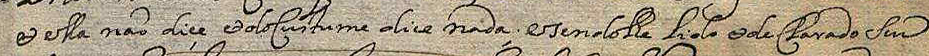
e ella naõ dice, e do Custume dice nada; e sendolhe lido e deClarado Seu
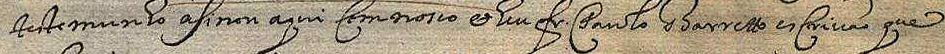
testemunho asinou aqui Comnosco e heu fr. Paulo Barretto esCriuaõ que
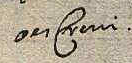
o esCreui.
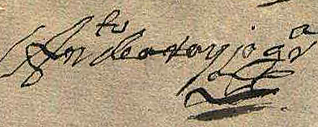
Anto de araujo pra
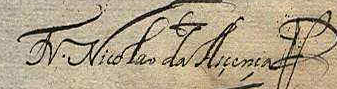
Fr. Nicolao da Ascençā
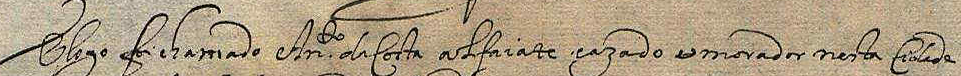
E logo foi chamado An.to da Costa alfaiate, cazado e morador nesta Cidade
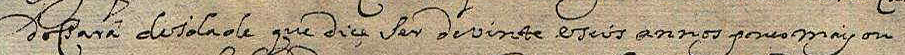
do Parâ de Idade que dice ser de vinte e seis annos pouco mais ou
